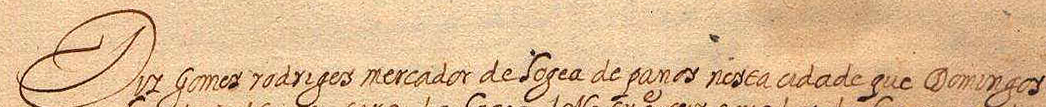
Diz gomes rodriges mercador de logea de panos nesta cidade que Domingos
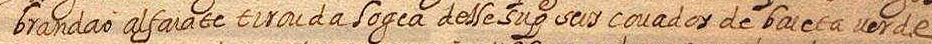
brandaõ alfaiate tirou da logea delle supe seis couados de baieta uerde
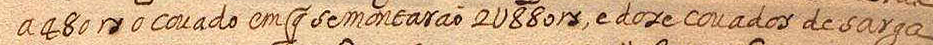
a 480 rs o couado em q̄ se montaraõ 2$080 rs, e doze couados de sarga
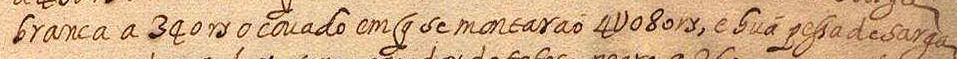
branca a 340 rs o couado em q̄ se montaraõ 4$080 rs, e huā pessa de sarga
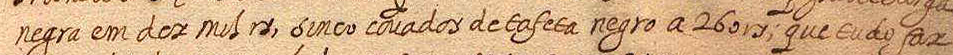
negra em dez mil rs, sinco couados de tafeta negro a 260 rs; que tudo por
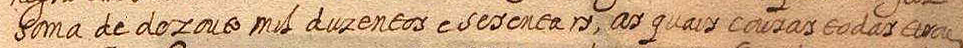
soma de dezouto mil duzentos e sesenta rs, as quais couzas todas tirou
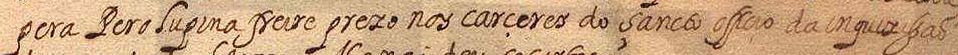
pera Pero lupina freire prezo nos carceres do sancto officio da inquizissaõ
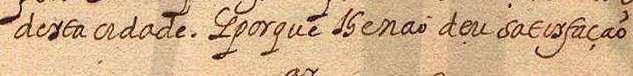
desta cidade. E porque lhe naõ deu satisfaçaõ
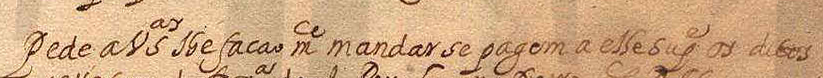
Pede a V Sas lhe façaõ mce mandar se pagem a elle supe os ditos
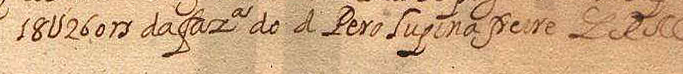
18$260 rs da faza do A Pero lupina freire E R M
